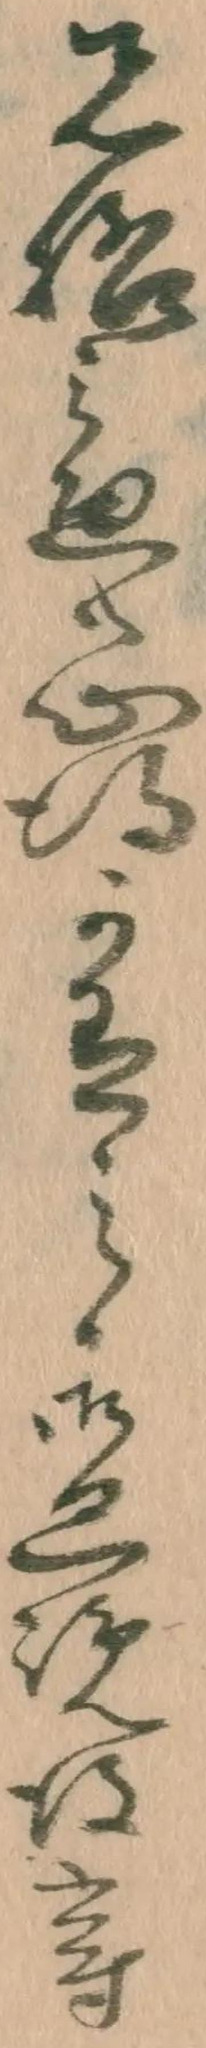先格之通御心得可有之候御廻覧後書付
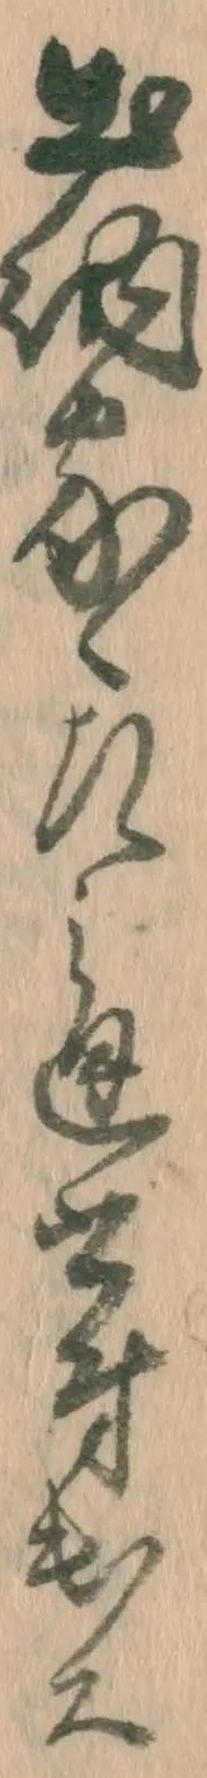出納家へ左之通書付出ス
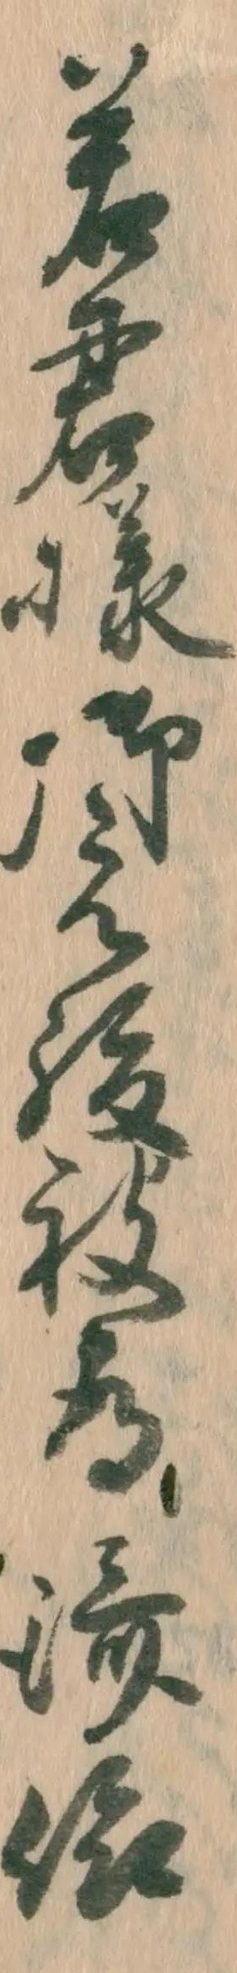若君様御元服被為済依
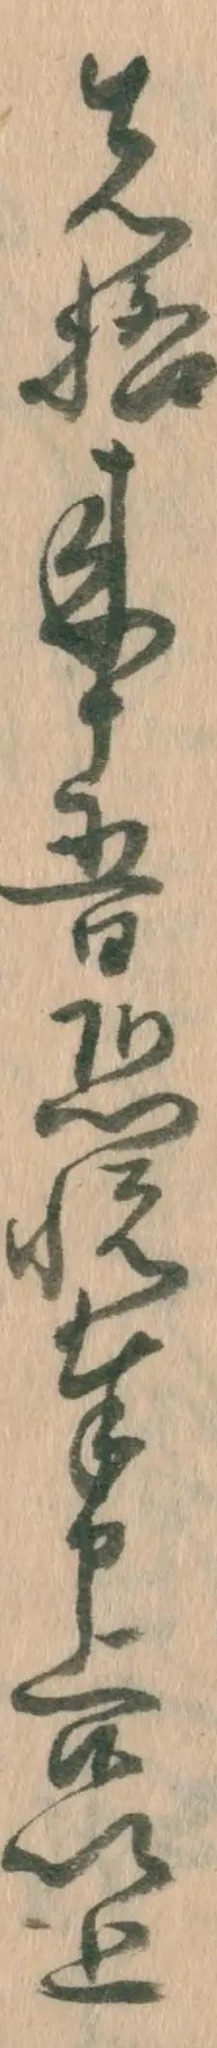先格来十五日恐悦奉申上候以上
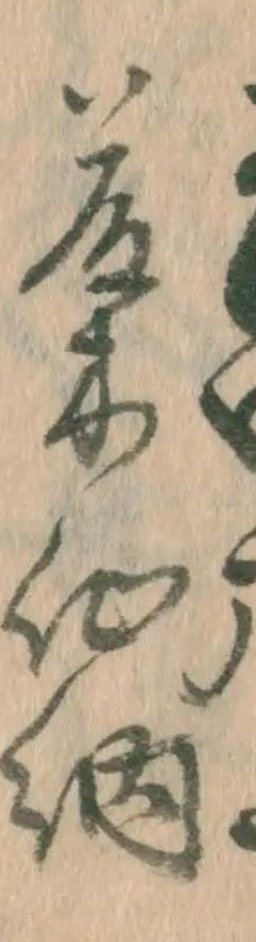藤木仙納
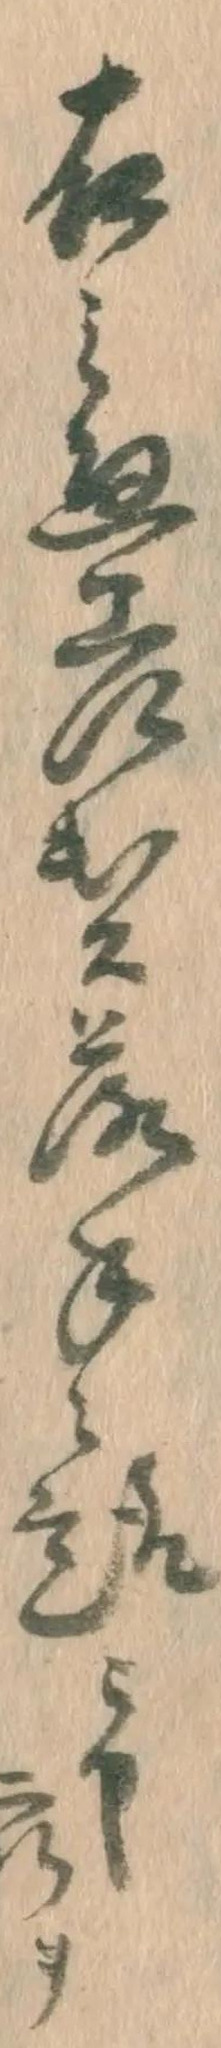右之通差出ス落手之趣被申候
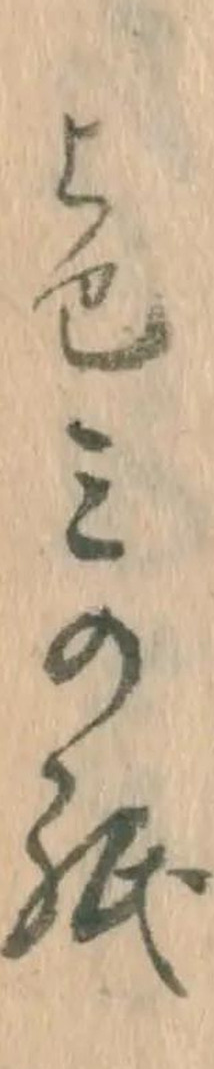上包ミの紙

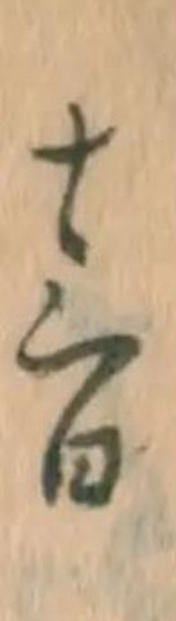十三日
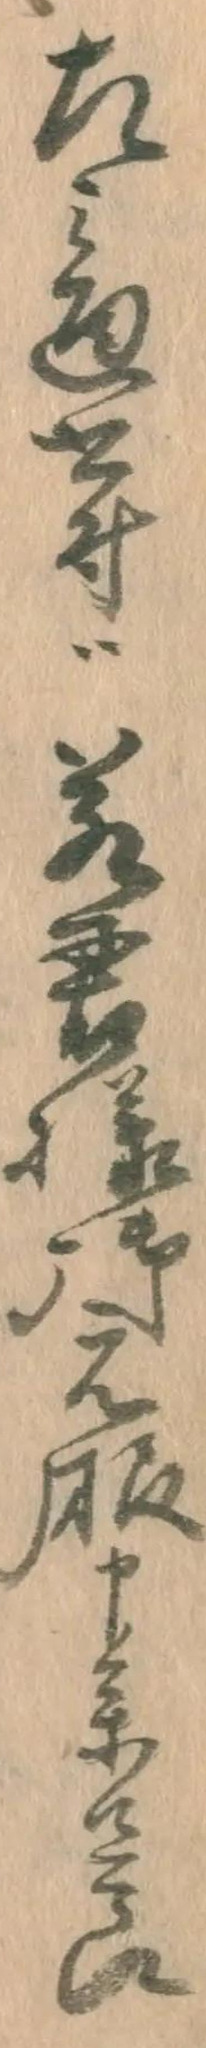同日左之通書付ハ若君様御元服申参候節
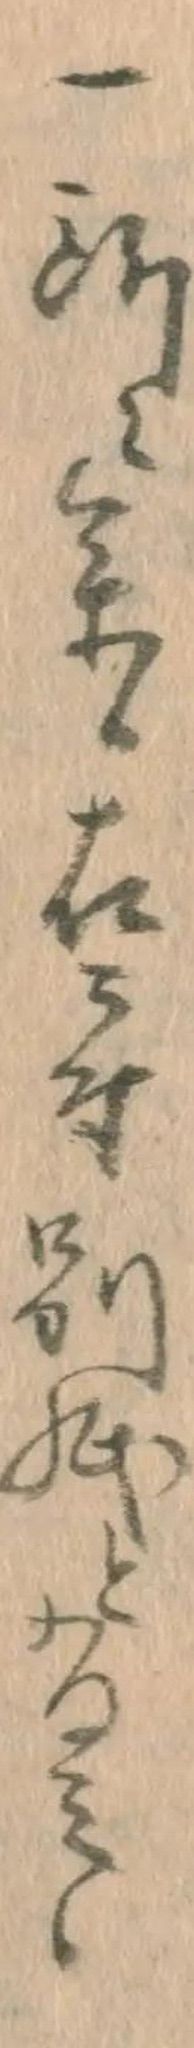一所ニ参候右ニ付別紙と有之候
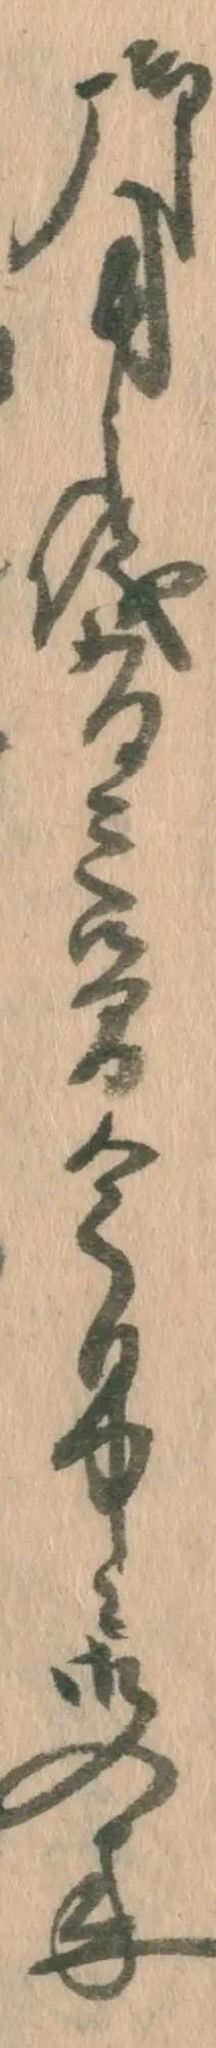御用之儀有之候間今日中ニ御入来
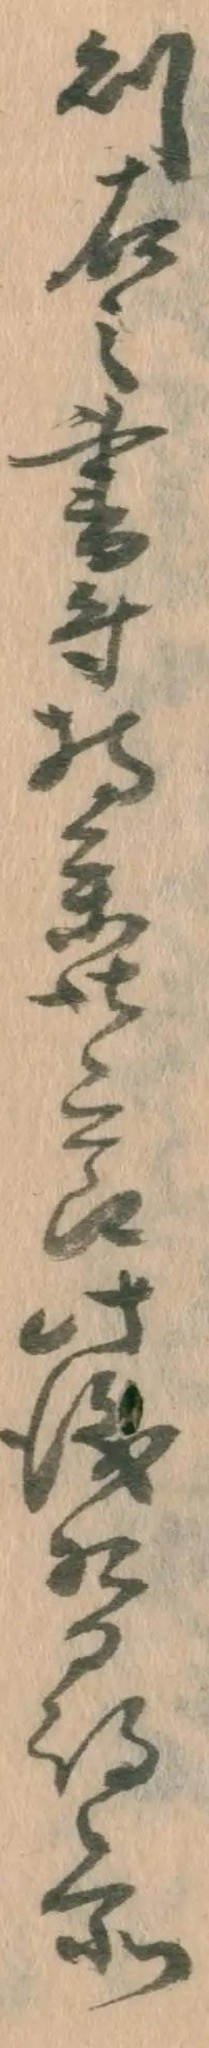則右之書付持参仕候節此儀被尋候所
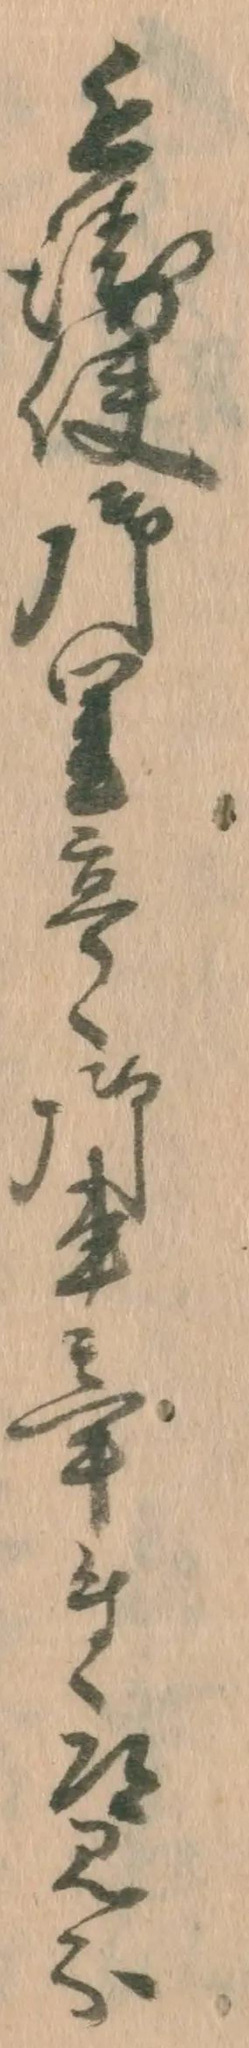近衛使御里亭へ御車牽付候道見分
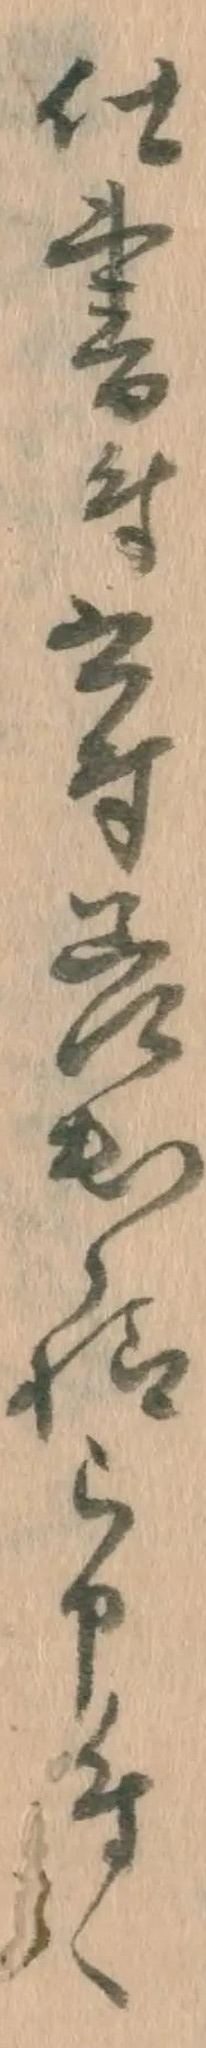仕書付書付差出候様被申付候
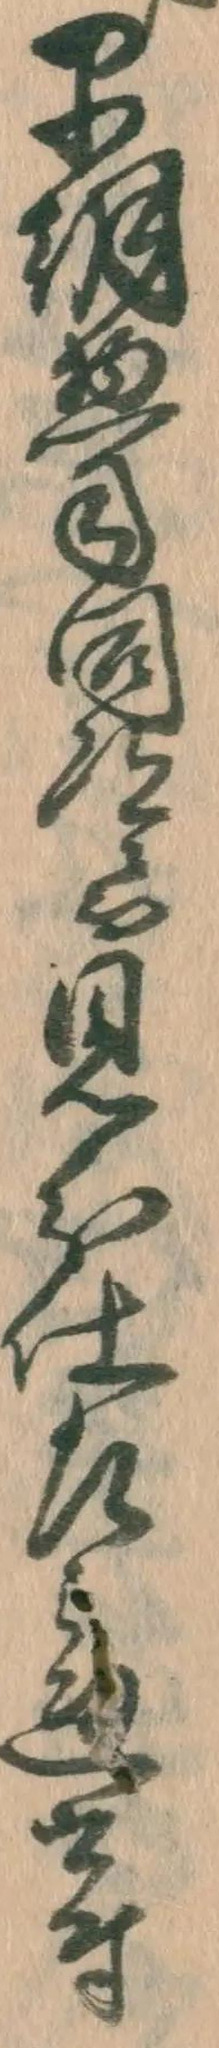早朝惣司同道ニ而見分仕左之通書付
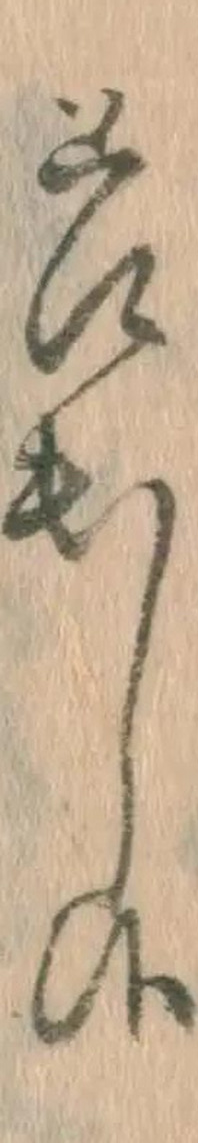差出し候
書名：賀茂社記録. 第61冊
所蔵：国立国会図書館 National Diet Library, JAPAN
